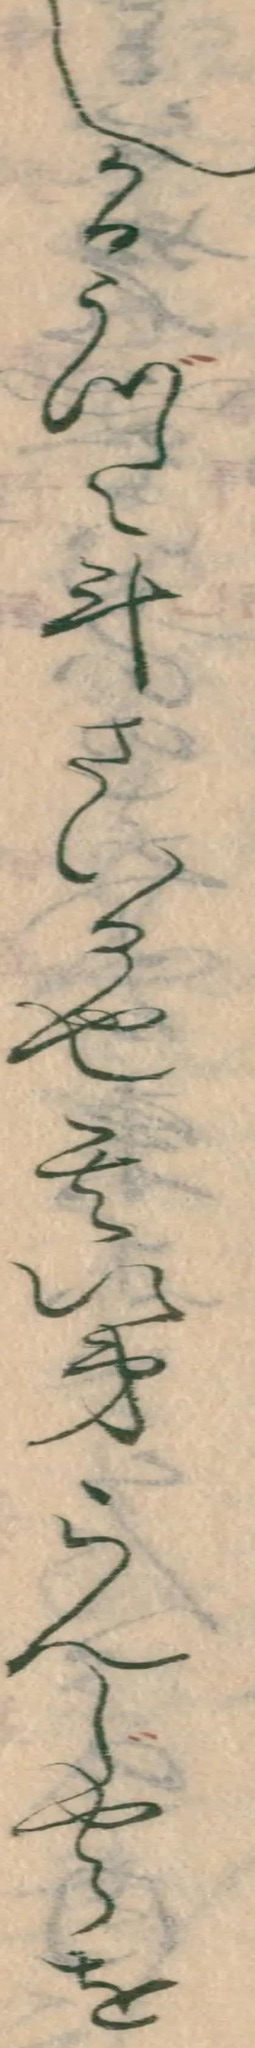かるうづえ計まいる也其次第らんじやうを
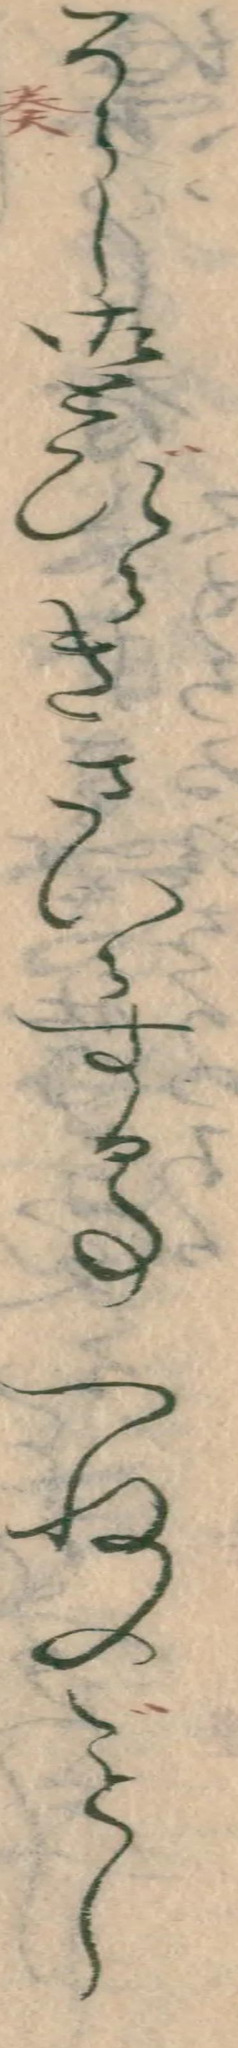そうし御とびらきまいらする事つねのごとし
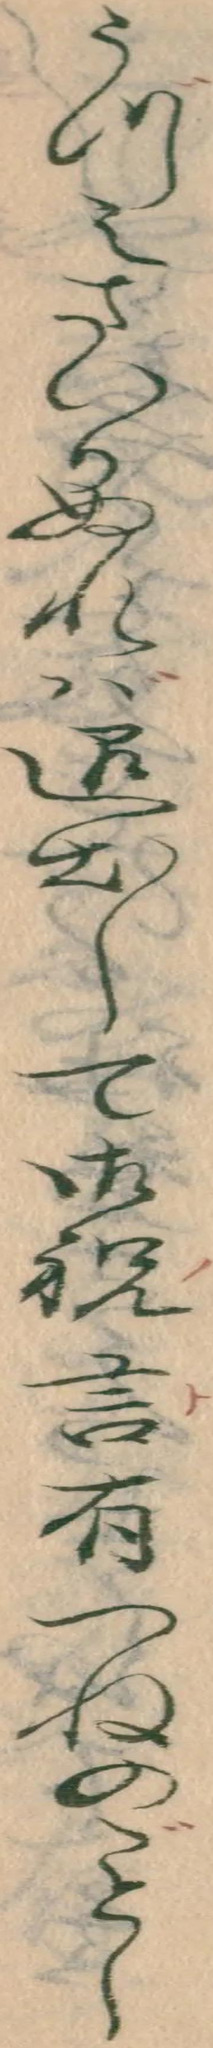うづえまいりぬれば退出して御祝言有つねのごとし
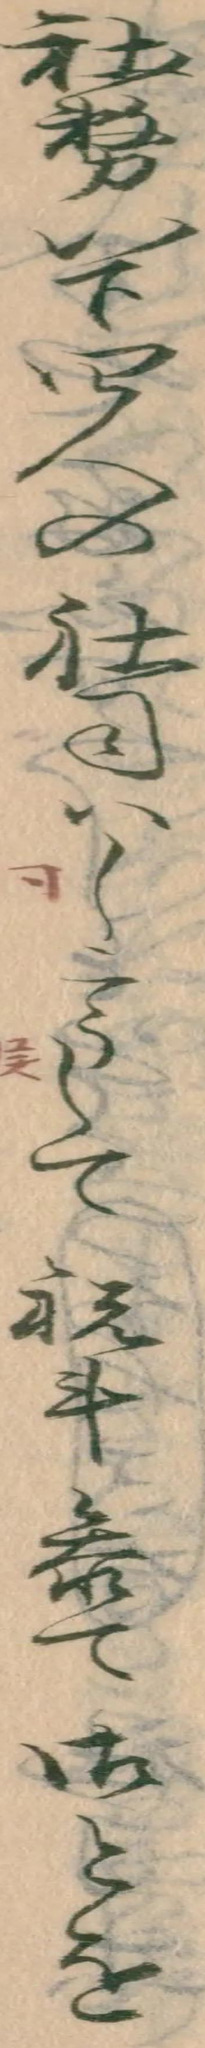社務い下四人の社司はしこうして祝計参て御とを
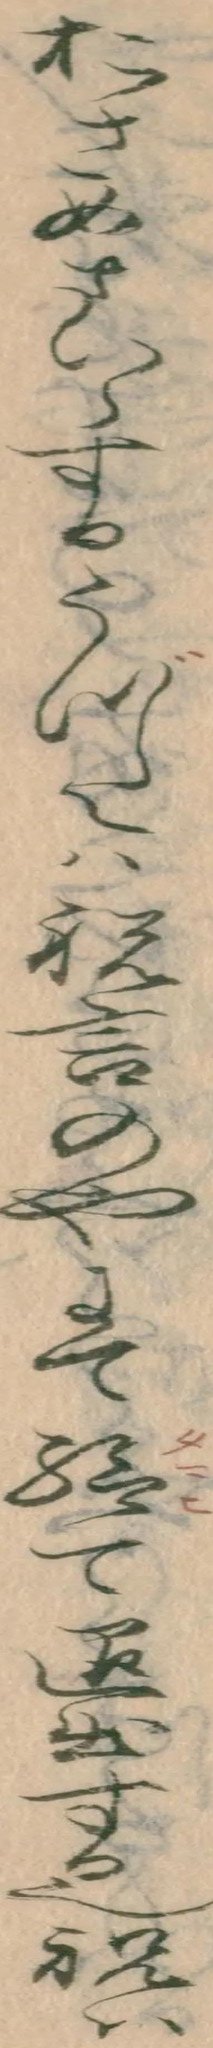おさめまいらするうづえは祝言のやにて給て退出する也祝は
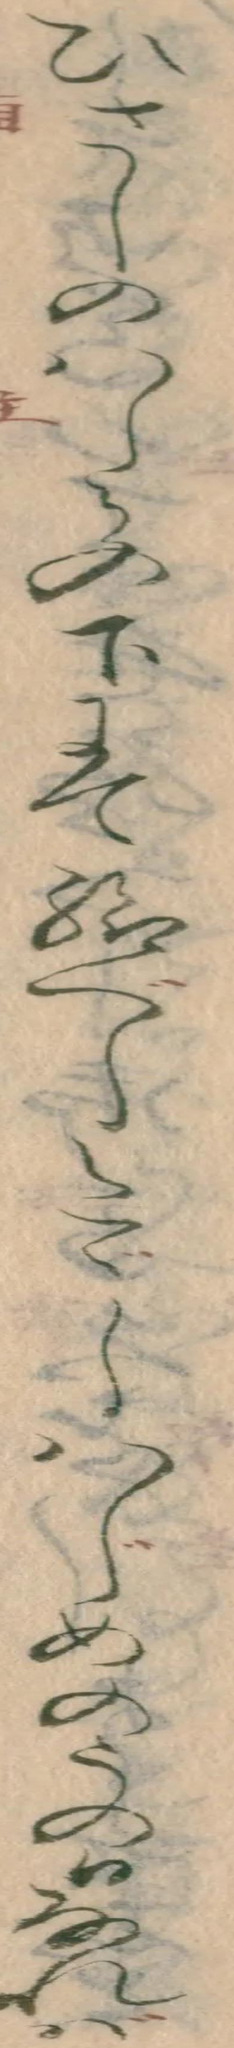ひさしのはしらの下にて給べしたゞしはじめのうの日なれば
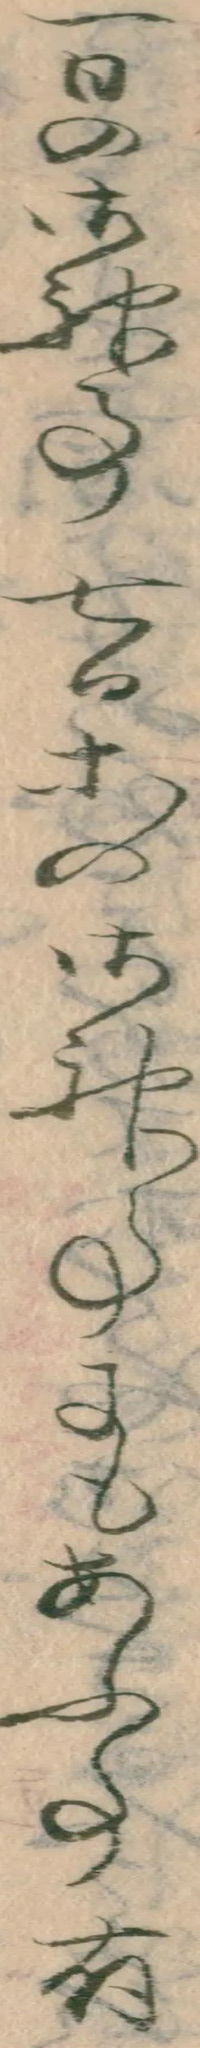一日の御神事七日等の御神事にもあふ事有
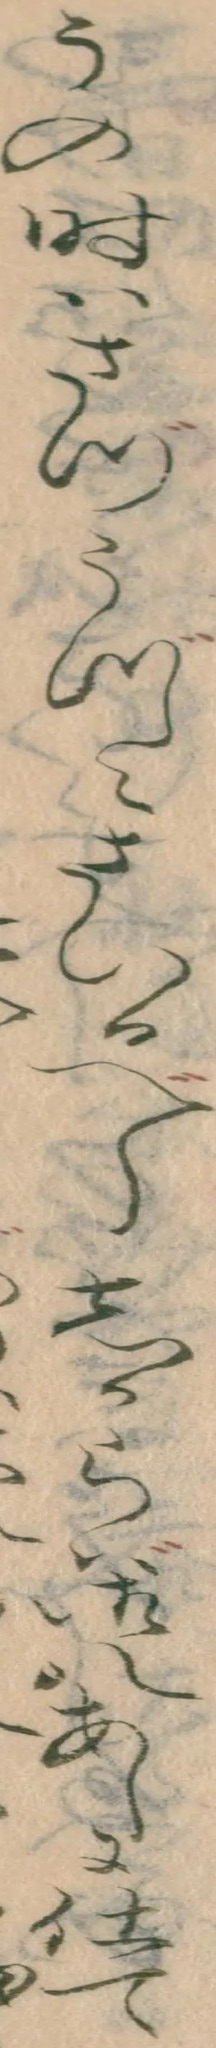うの時はまづうづえまいるべししからば御八あしに仕て
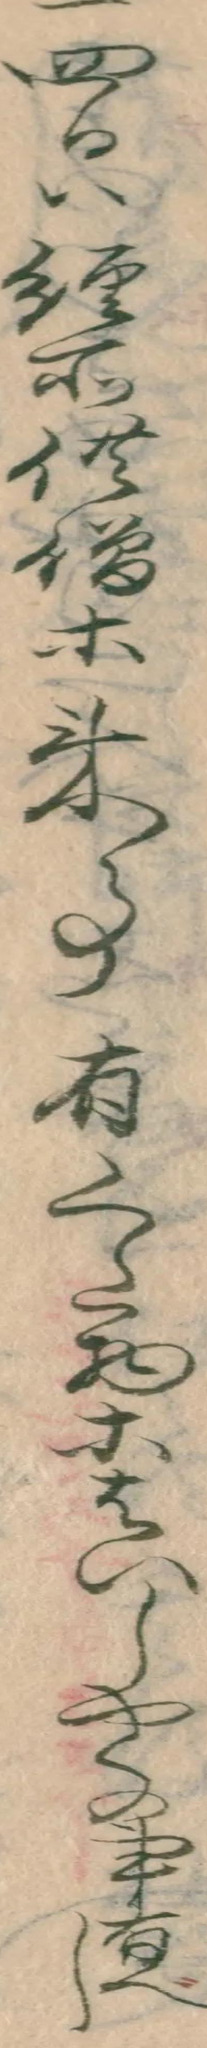一四日は経所供僧等来事有くた物等はいしやくの事有べし
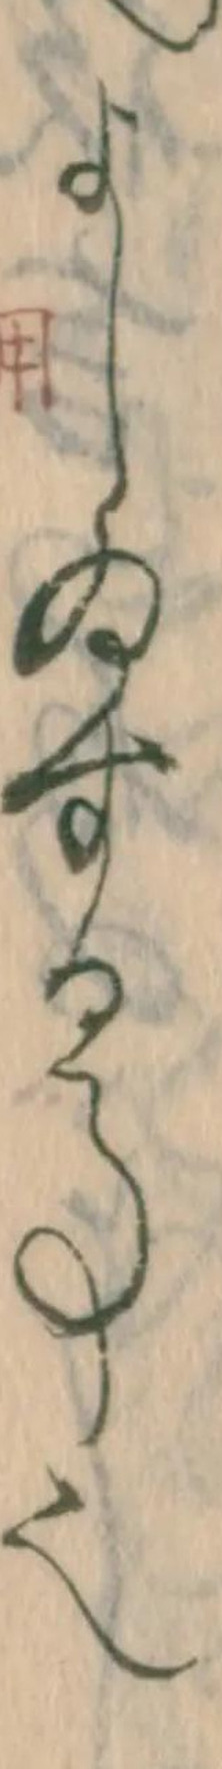ようゐする事也
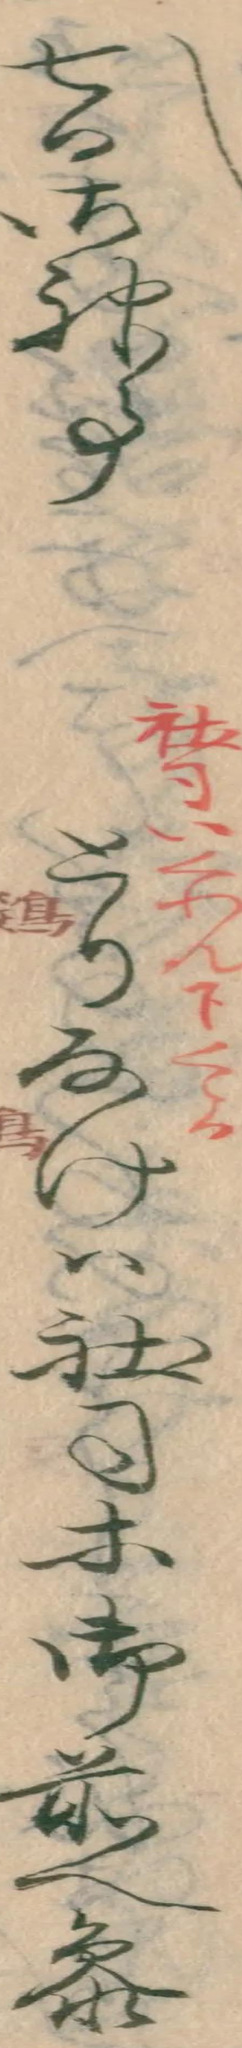一七日御神事とりなけは社司等御前へ参
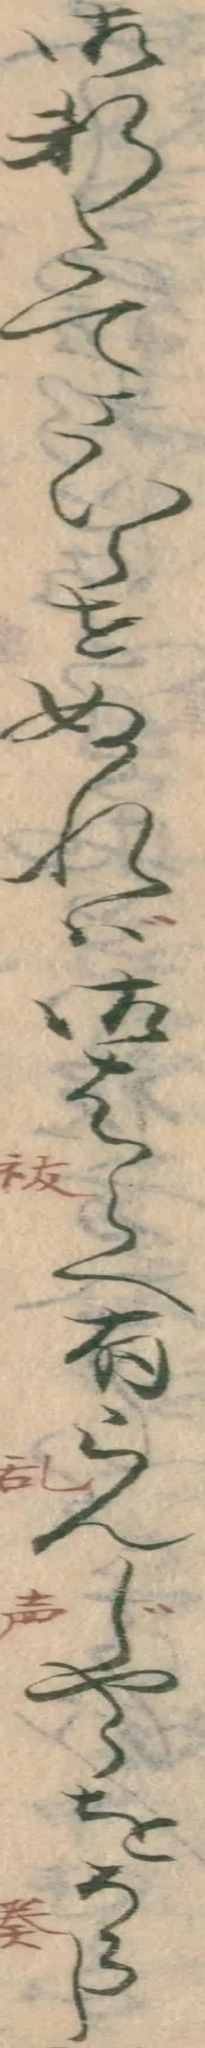御料たてまいらせぬれば御はらへ有らんじやうをそうし
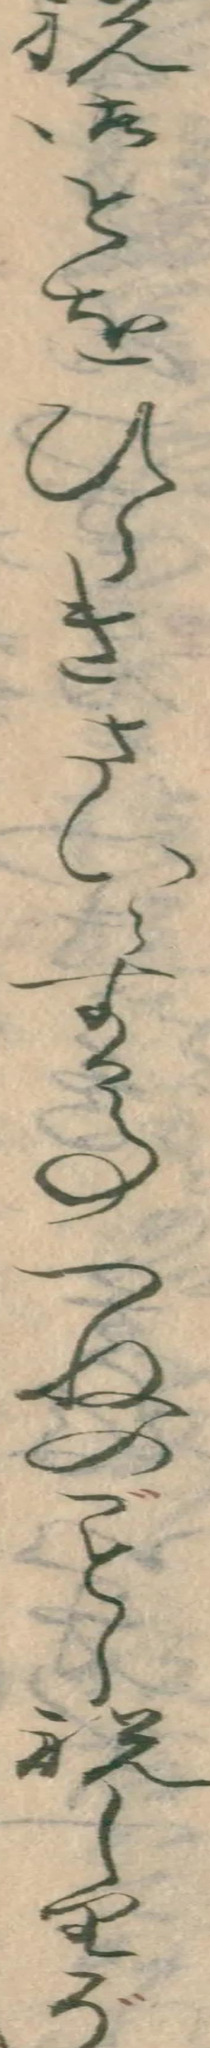祝御とをひらきまいらする事つねのごとし祝しりぞき歟
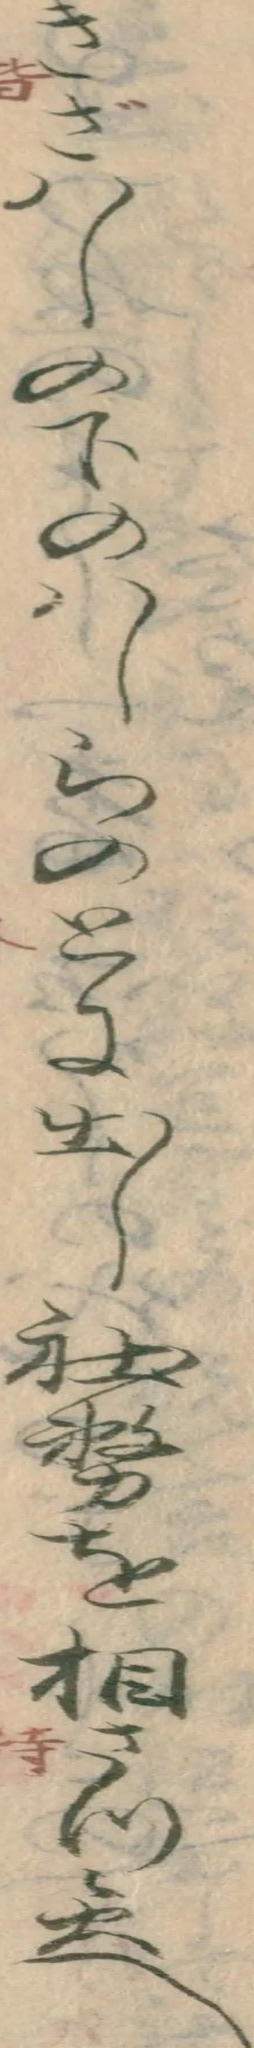きざはしの下のはしらのとに出し社務を相まつ火
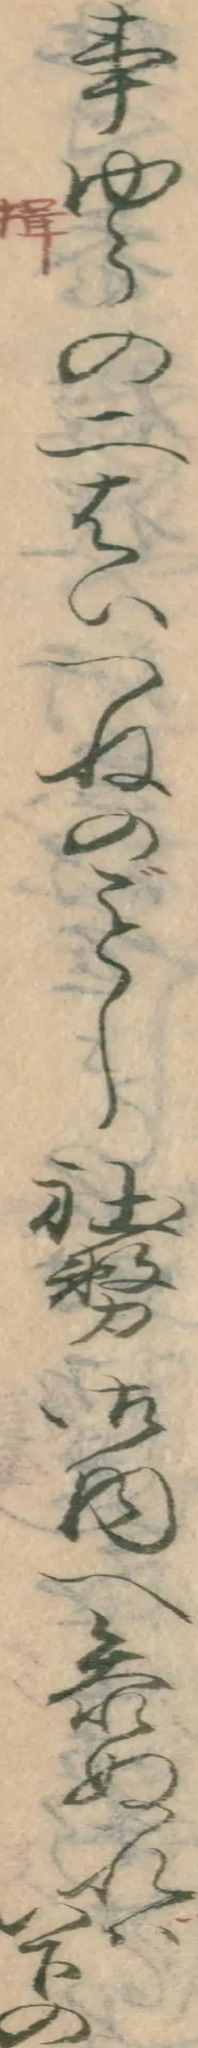事ゆうの二はいつねのごとし社務御内へ参ぬれはい下の

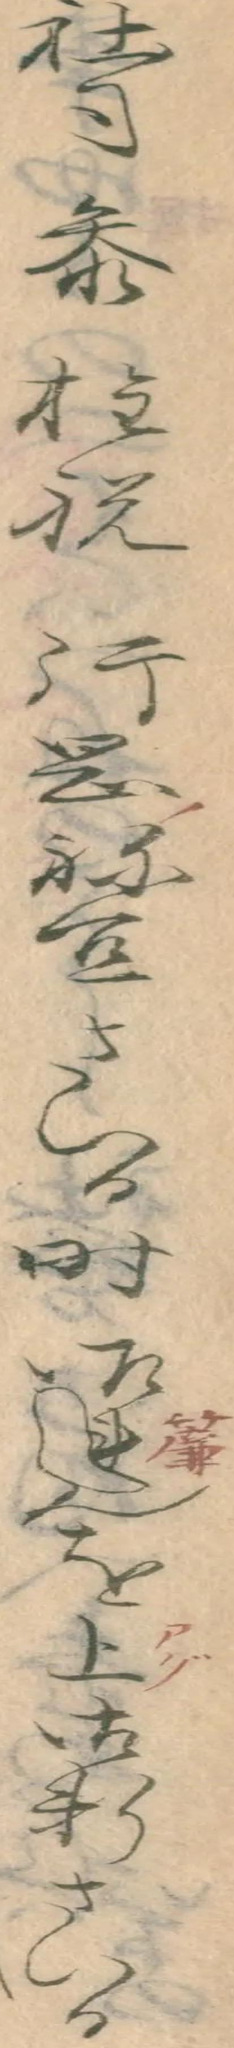社司参権祝行岡祢宜まいる時御れんを上御料まいる
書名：賀茂社記録. 第3冊
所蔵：国立国会図書館 National Diet Library, JAPAN
